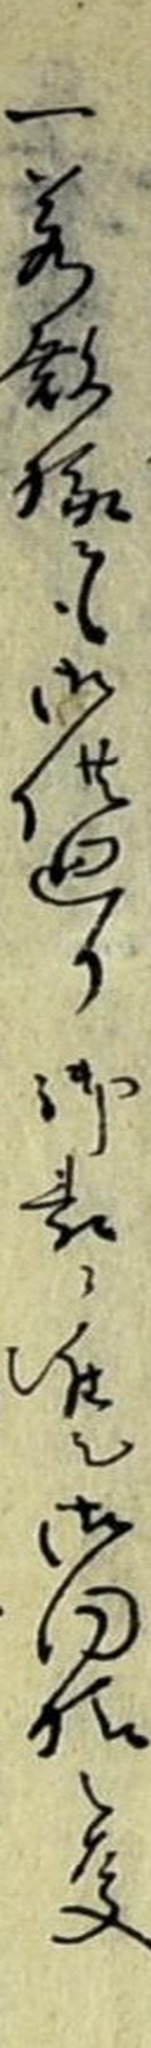一若殿様にも御供廻り御表に准し御同様之事
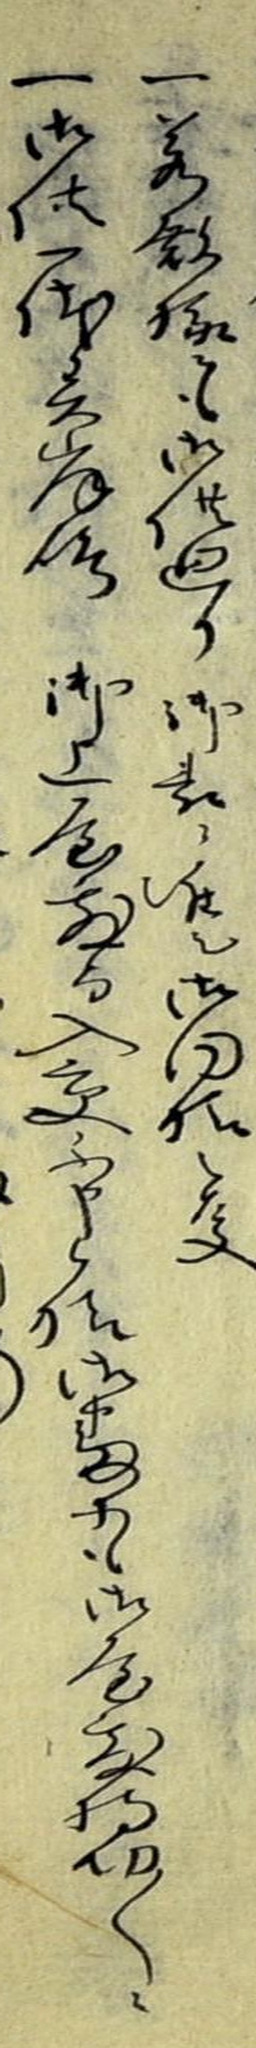一御供一体霊岸嶋御上屋敷与入交不申候様御番にも御屋敷持切〳〵に
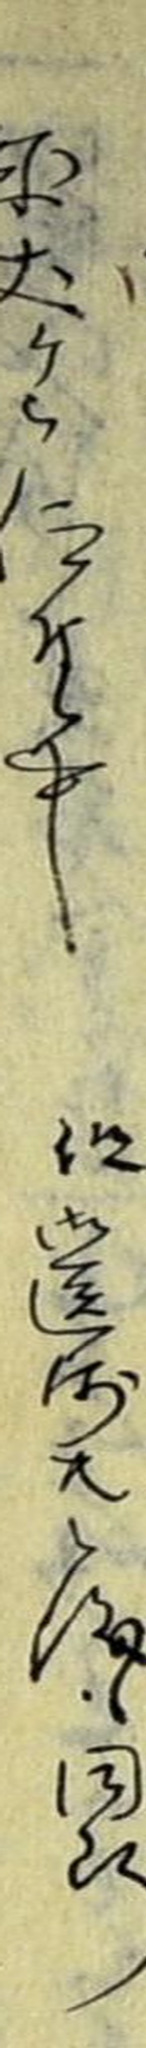成丈ヶ被仰付候事但御医師共之儀も同断
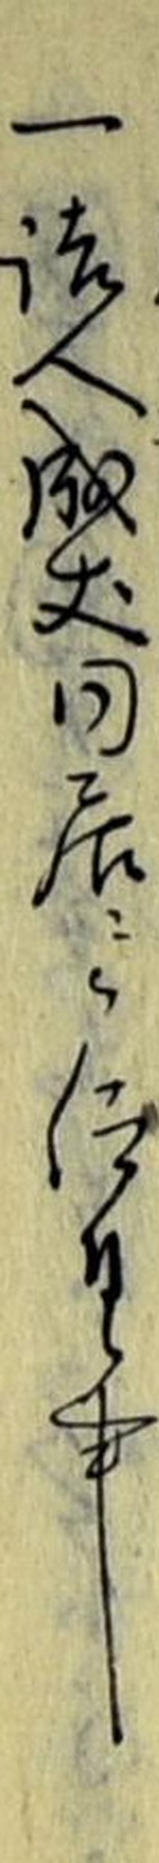一詰人成丈同居に被仰付候事

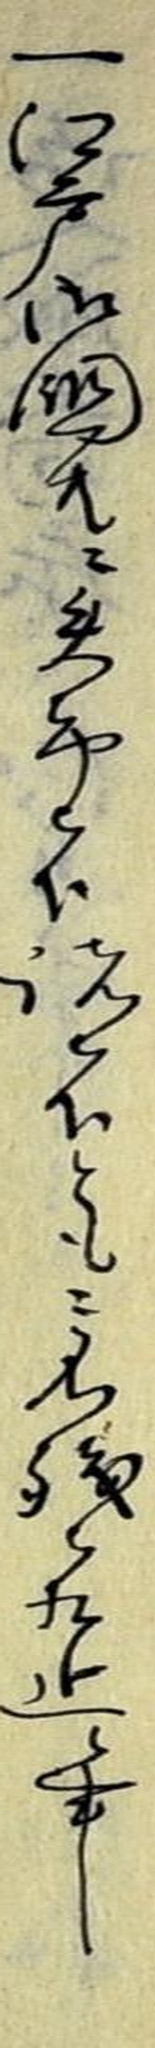一江戸御国共に失却被下諸被下ともに不残被相止候事
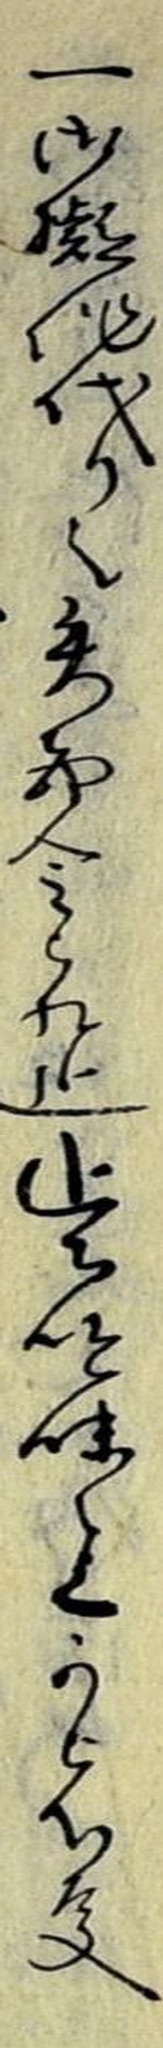一御擬作代り之失却金被相止追而吟味之上可被下事
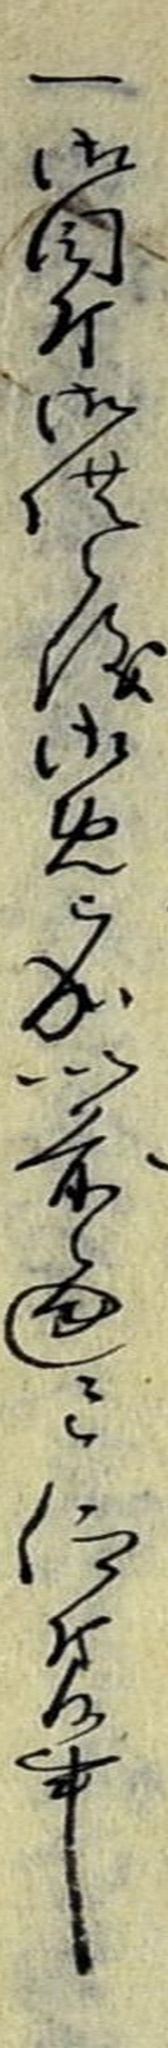一御目付御供之儀御免被成以前之通に被仰付候事
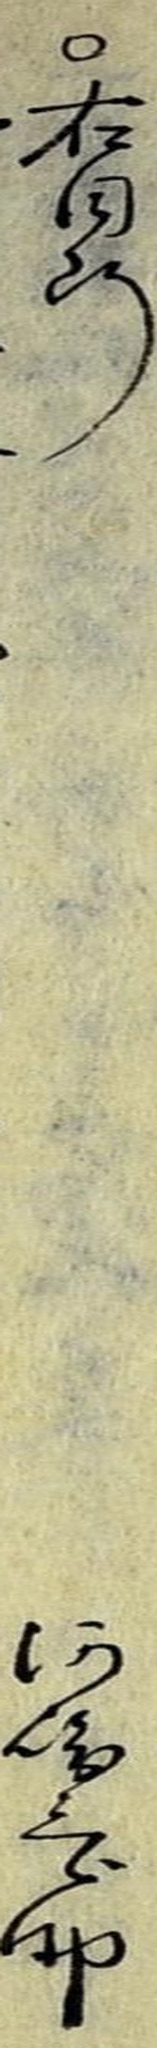〇右同断河崎三郎助
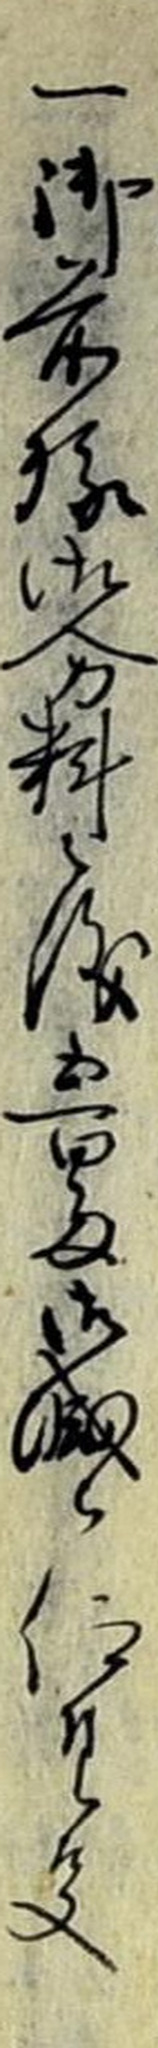一御前様御分料之儀五百両御減被仰付候事
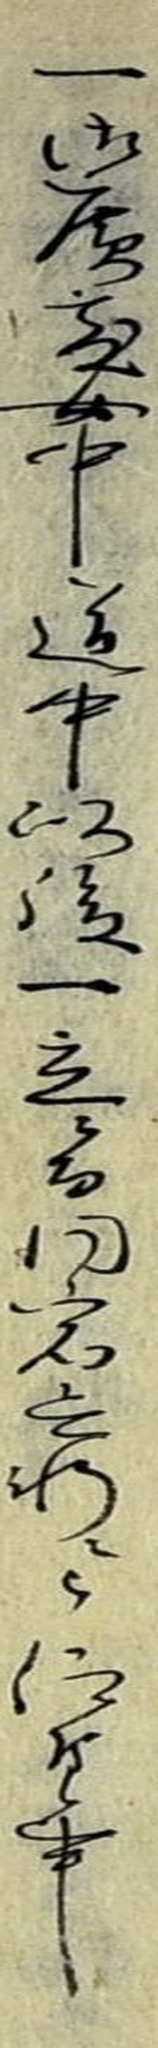一御広敷女中道中以後一立に而同宿壱軒に被仰付候事
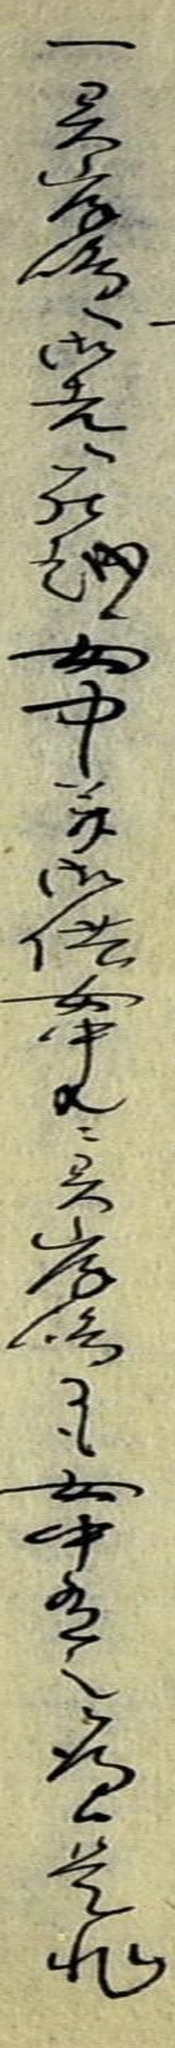一霊岸嶋へ御先へ罷越候女中并御供女中共に霊岸嶋にも女中有之候得は是非
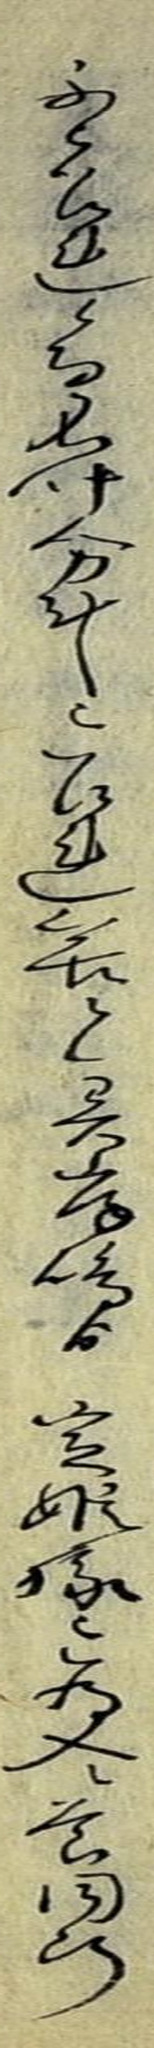不被召連候而不叶分斗被召連筈に候霊岸嶋ゟ定姫様被為入候節同断
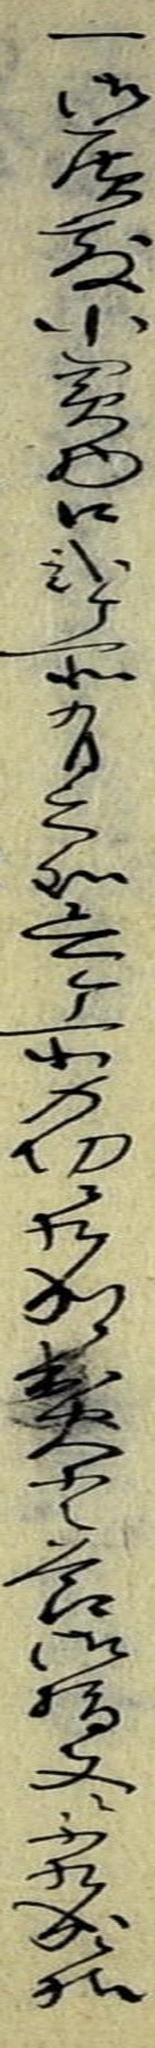一御広敷小買物口弐ヶ所有之処壱ケ所〆切に相成候出火等之節御指支に不相成候様
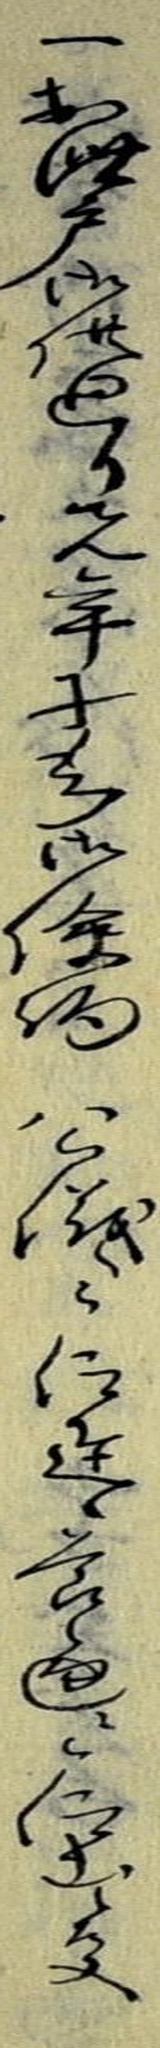一於江戸御供廻り先年刁年御倹約公儀へ被仰達候節之通に被仰出候事
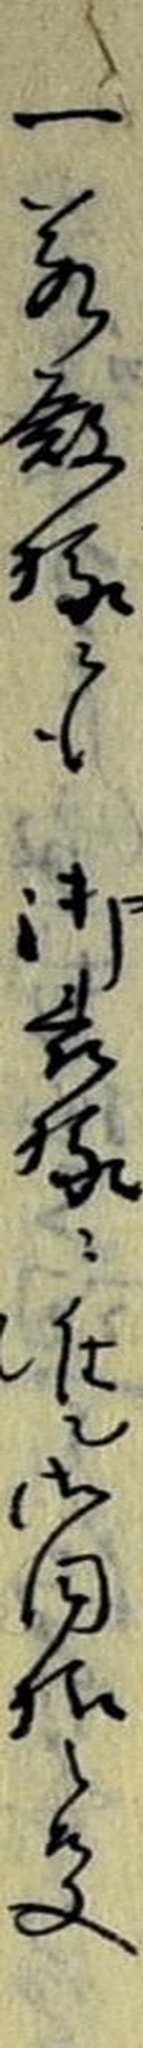一若殿様にも御表様に准し御同様之事
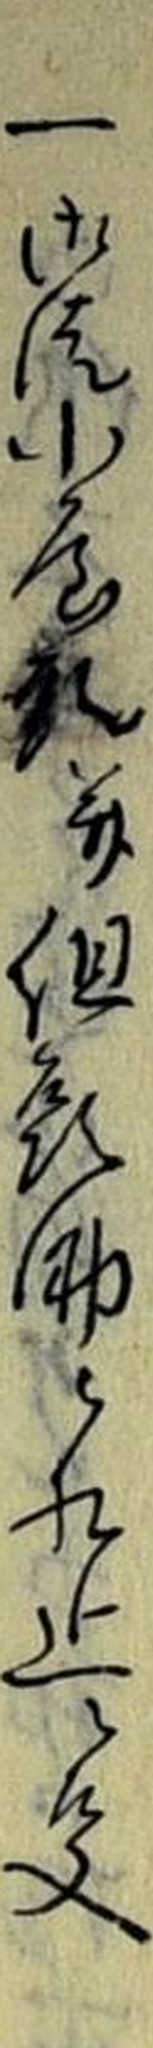一御徒小屋頭并組頭助被相止候事
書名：命令之部 二
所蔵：福井県文書館 Fukui Prefectural Archives
